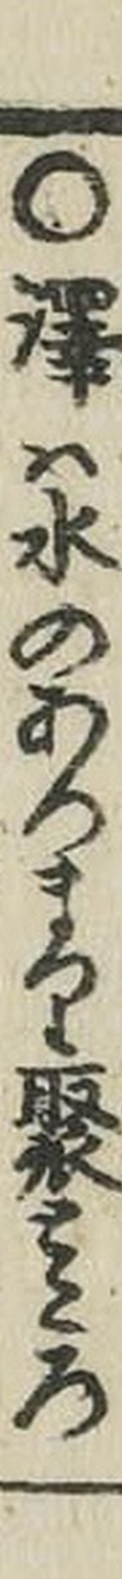○沢は水のあつまり聚ところ
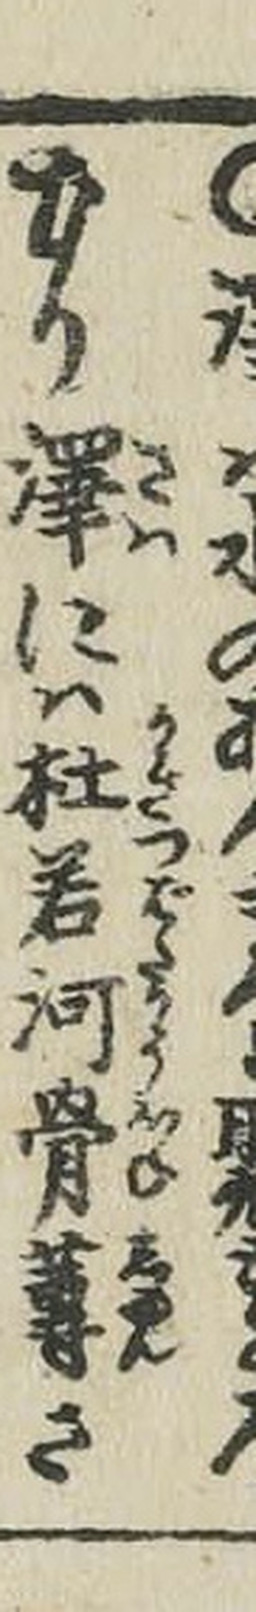なり沢には杜若河骨蓴さ
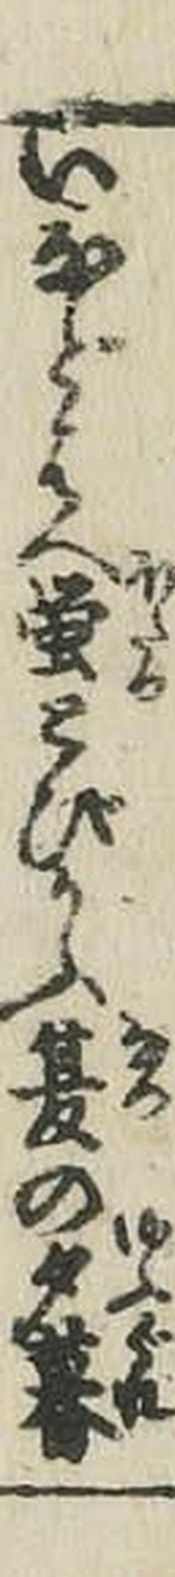いなどはへ蛍とびかふ夏の夕暮
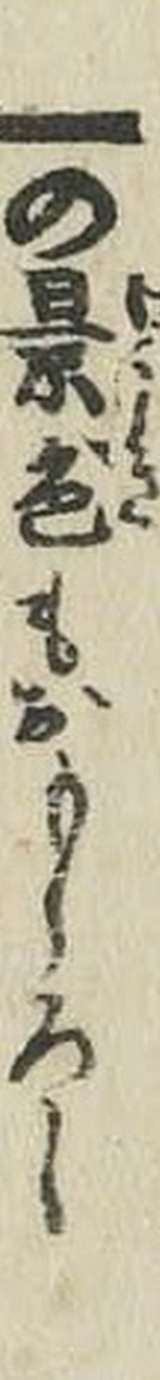の景気もおもしろし
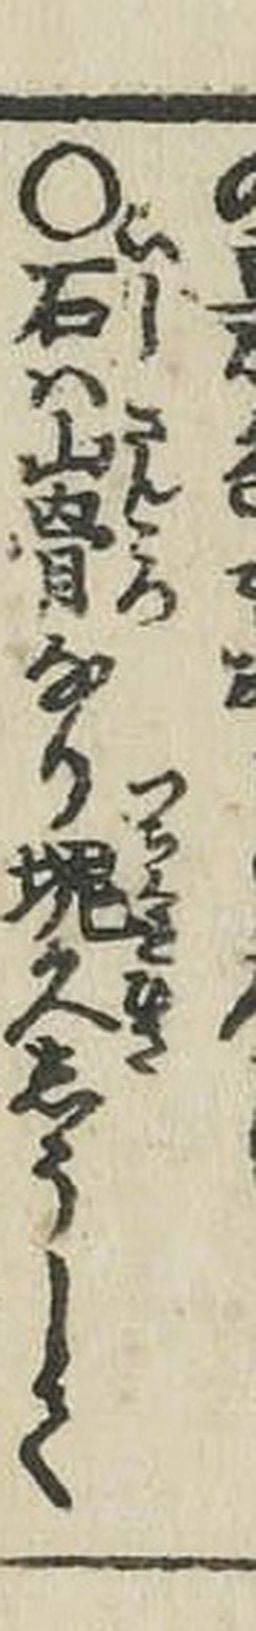○石は山骨なり塊久しうして
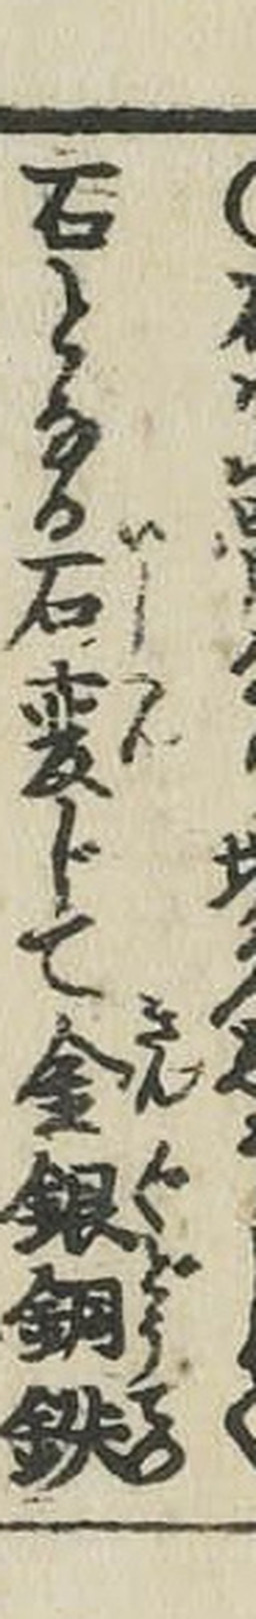石となる石変じて金銀銅鉄
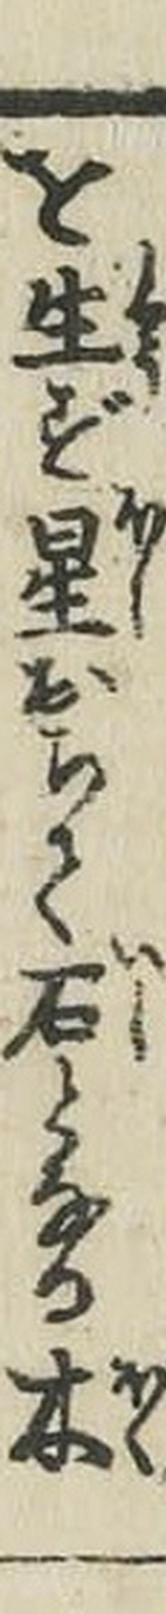を生ず星おちて石となる木
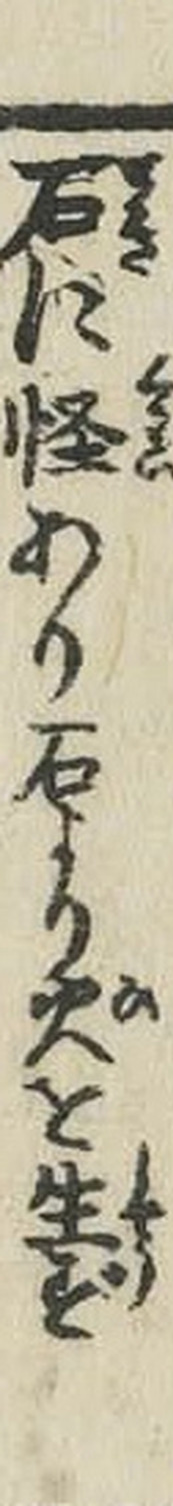石に怪あり石より火を生ず
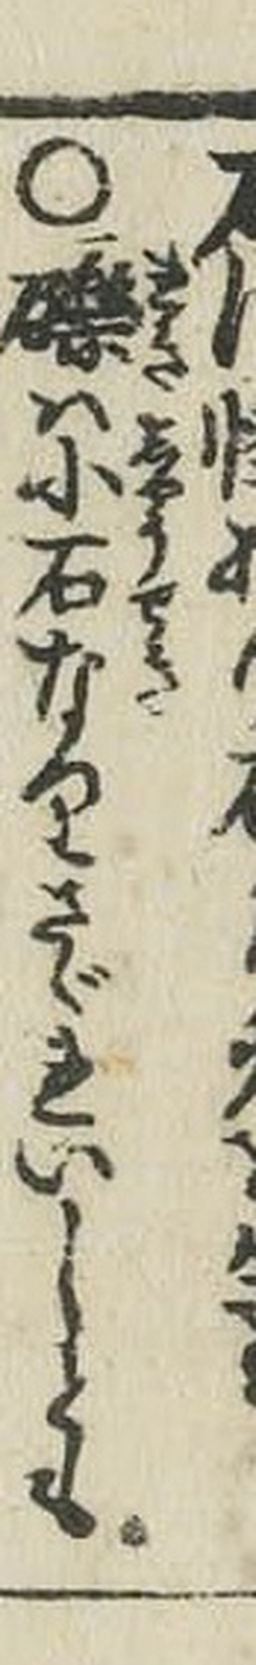○礫は小石なりさゞれいしとも
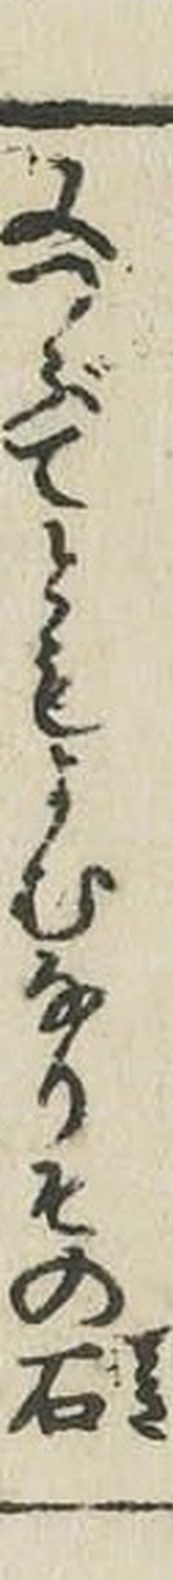又つぶてともよむなりその石
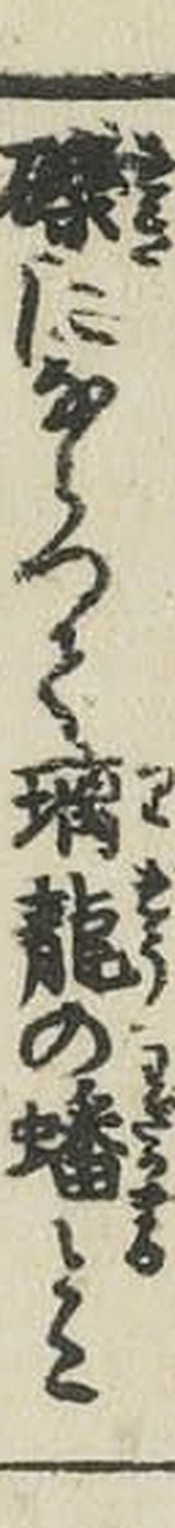礫にならつて璃竜の蟠とこ
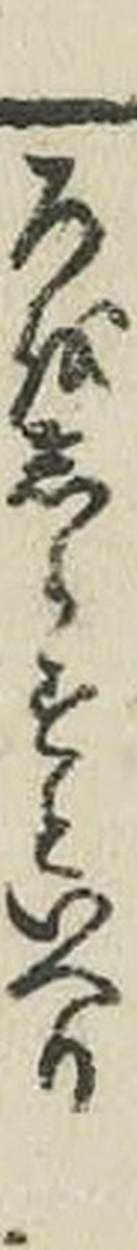ろをしらすといへり
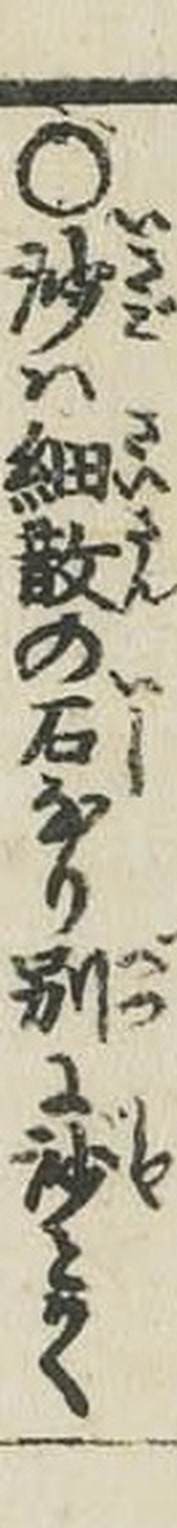○沙は細散の石なり別に沙とかく
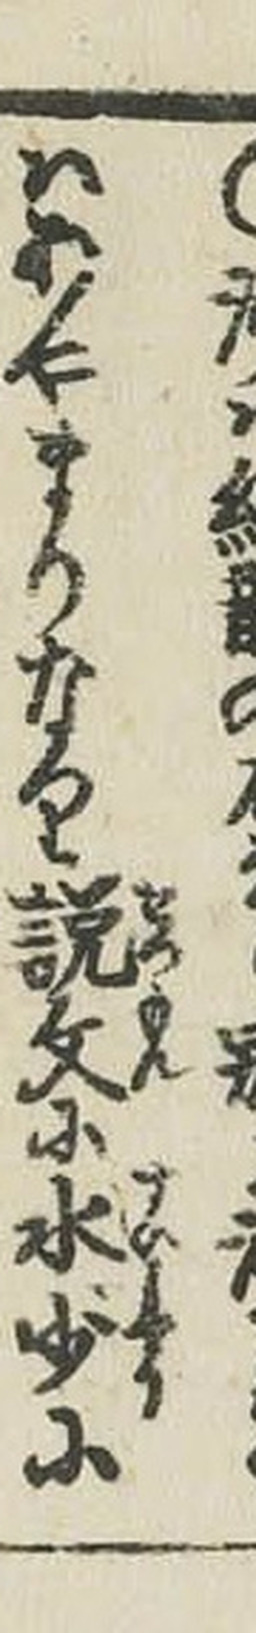はあやまりなり説文に水少に
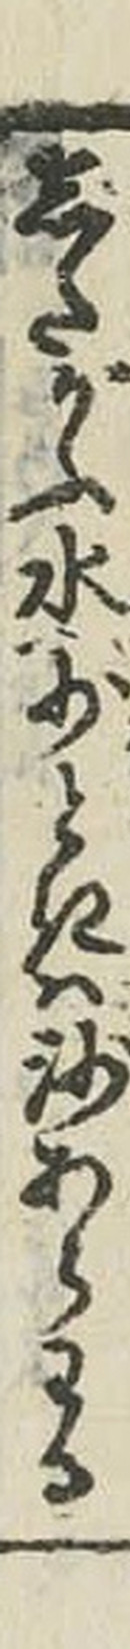したがふ水少ときは沙あらわる
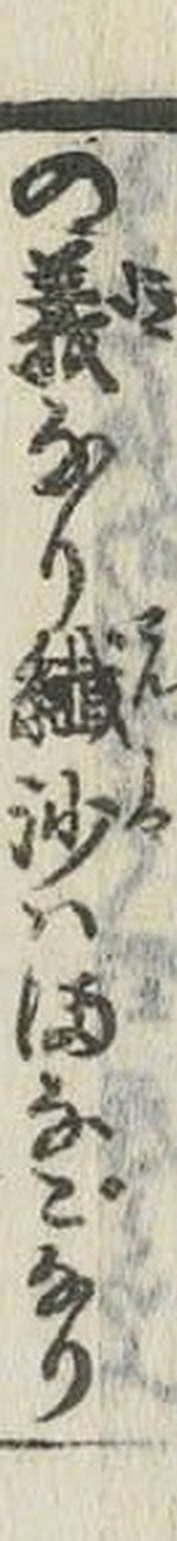の義なり繊沙はまなごなり
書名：増補頭書訓蒙図彙大成 10巻 2:巻之1-3
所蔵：東京学芸大学教育コンテンツアーカイブ
